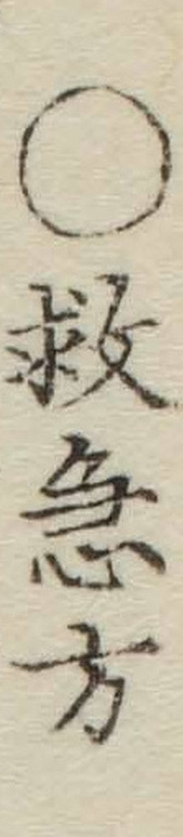○救急方
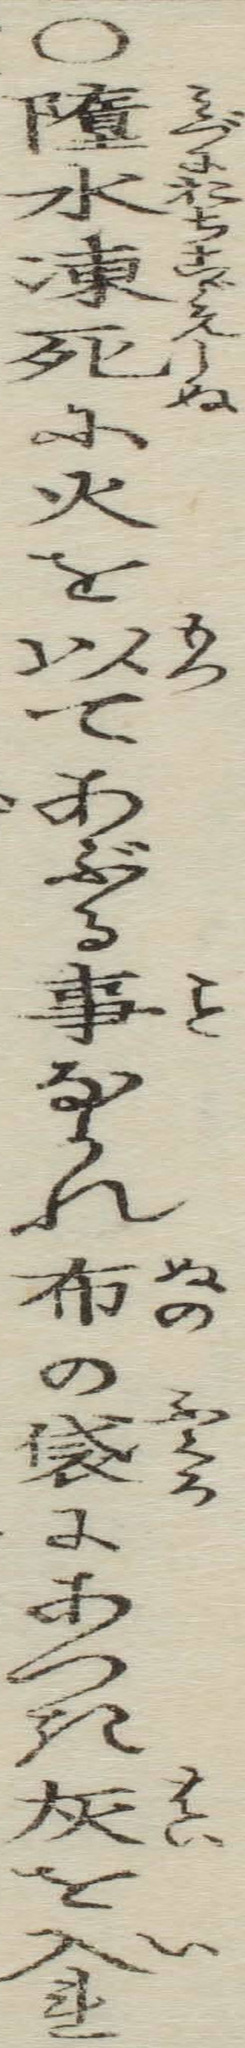○墮水凍死に火を以てあぶる事なかれ布の袋にあつき灰を入れ
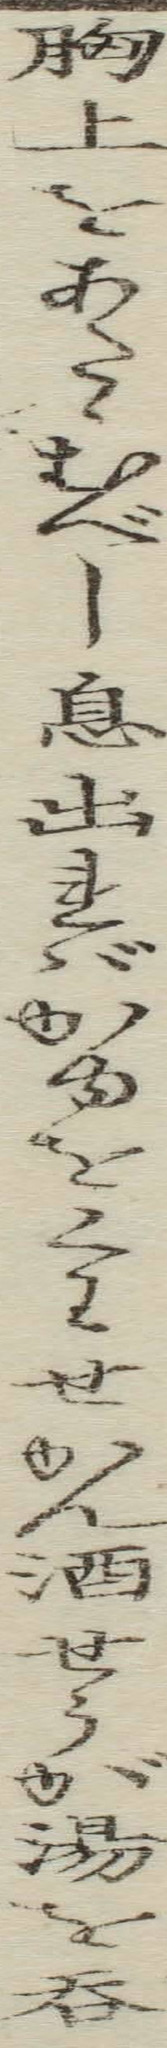胸上をあたゝむべし息出ればかゆをくわせかん酒せうが湯を呑
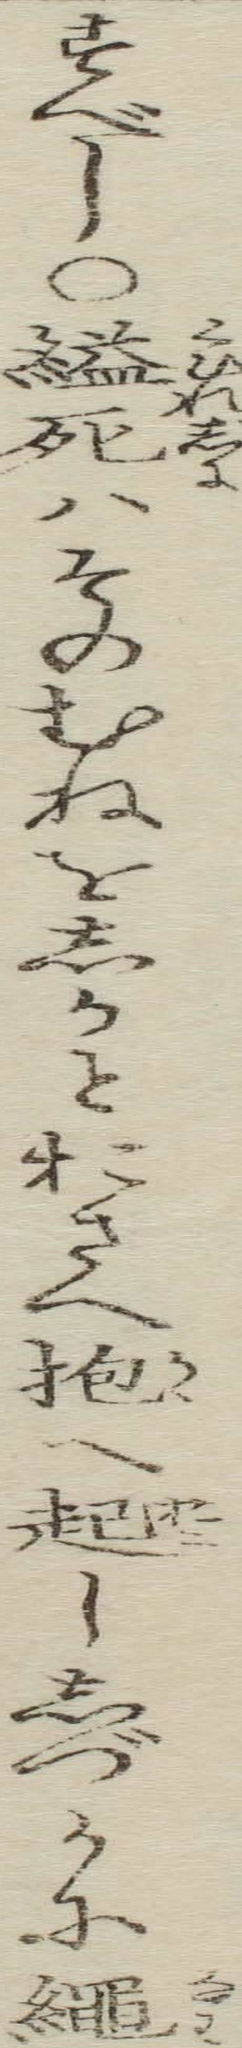すべし○縊死はそのむねをしかとおさへ抱へ起ししづかに縄
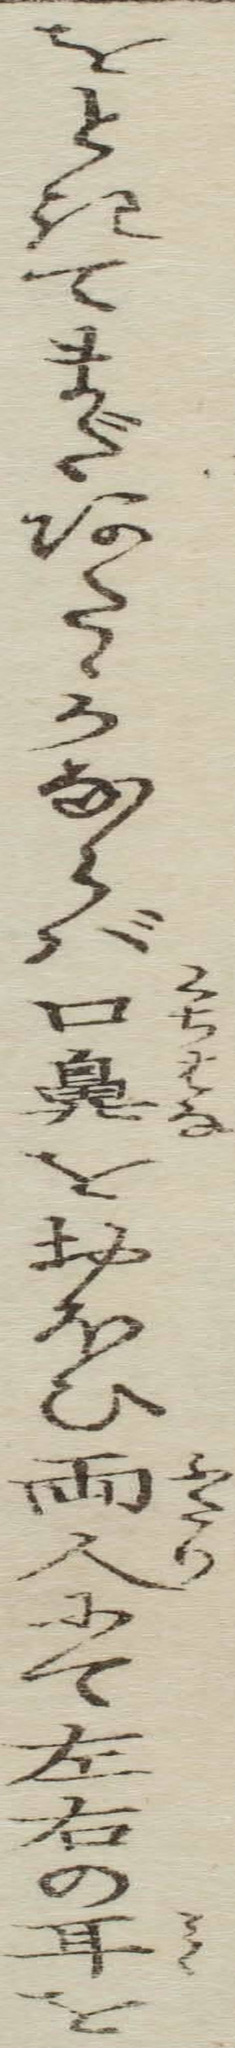をときてまだあたゝかならば口鼻をおほひ両人にて左右の耳を
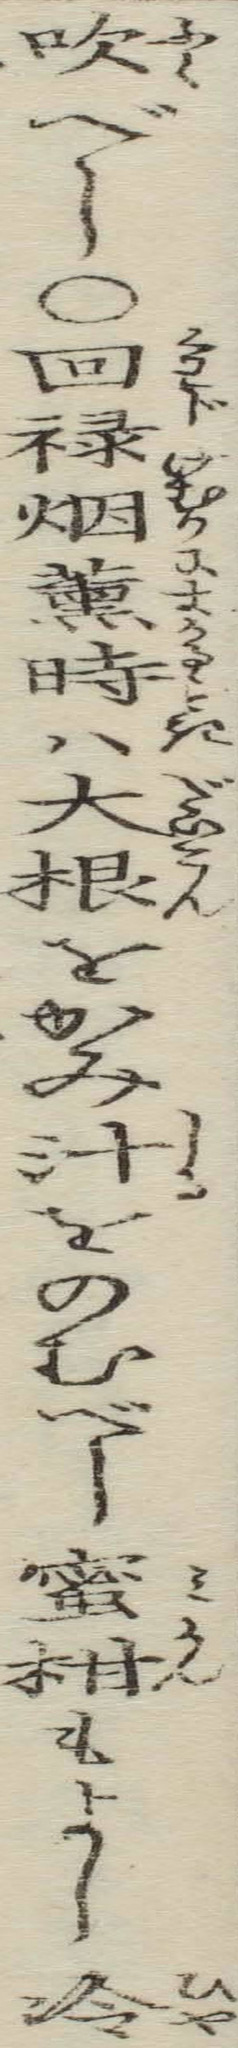吹べし○回禄烟薫時は大根をかみ汁をのむべし蜜柑もよし冷
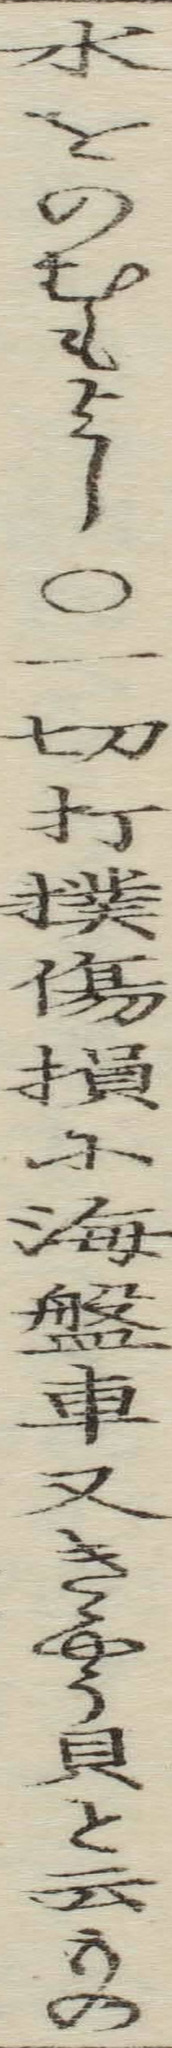水をのむもよし○一切打撲傷損に海盤車又きゝやう貝と云もの
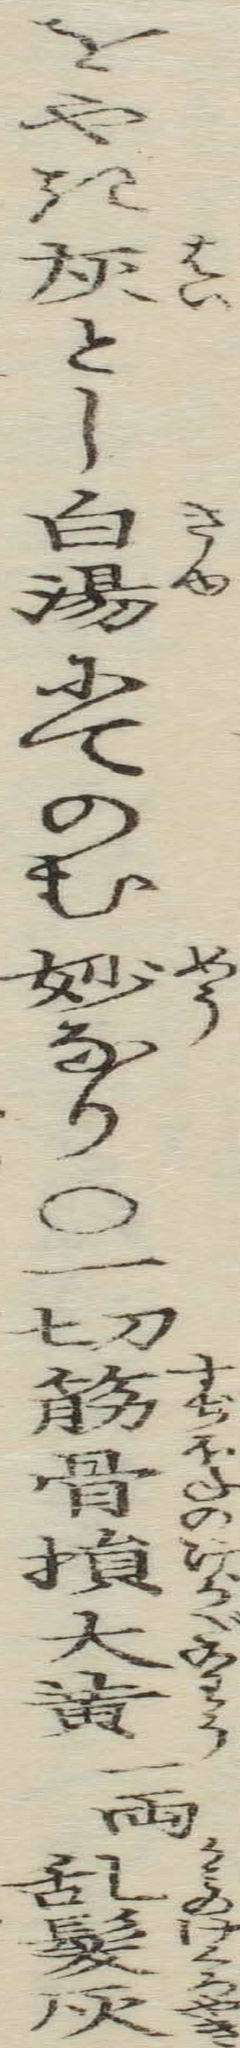をやき灰とし白湯にてのむ妙なり○一切筋骨損大黄一両乱髪灰
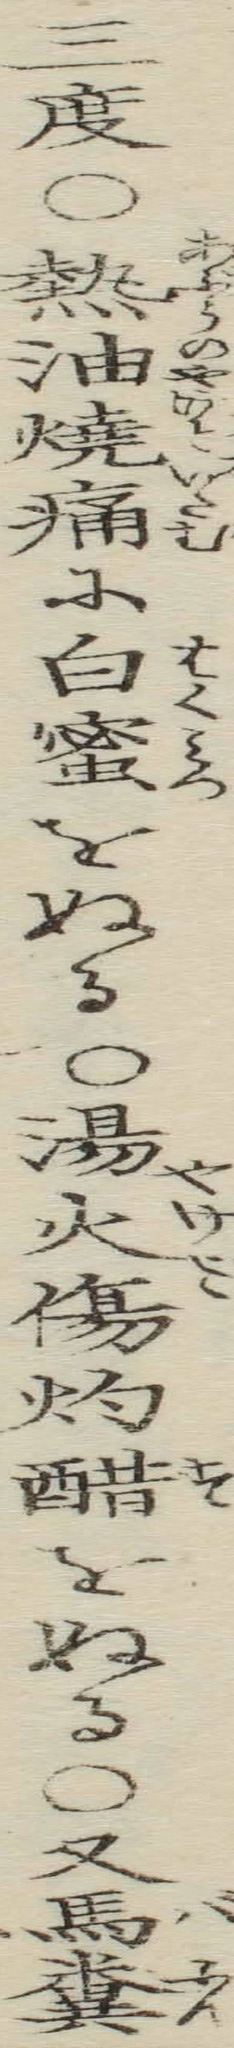三度○熱油焼痛に白蜜をぬる○湯火傷灼醋をぬる○又馬糞
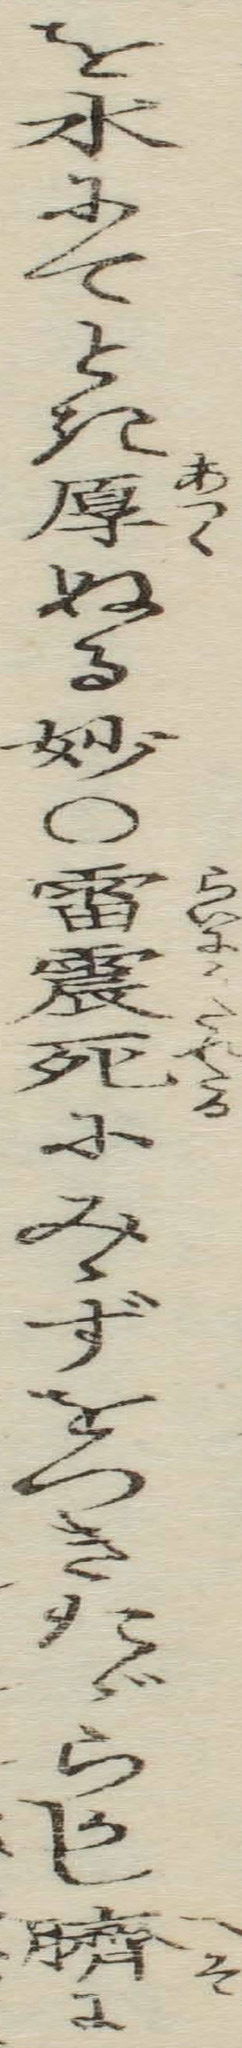を水にてとき厚ぬる妙○雷震死にみゝずをつきたゞらかし臍に
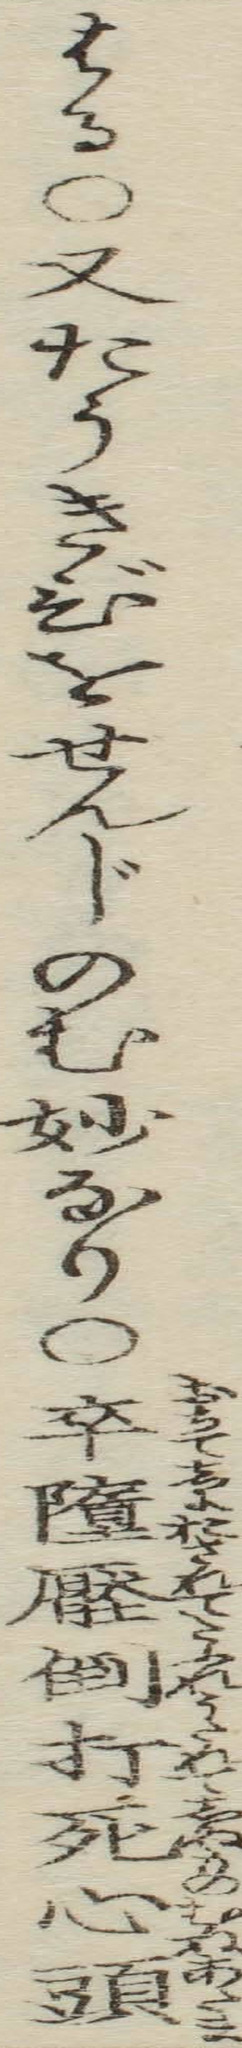はる○又たうきびをせんじのむ妙なり○卒墮壓倒打死心頭
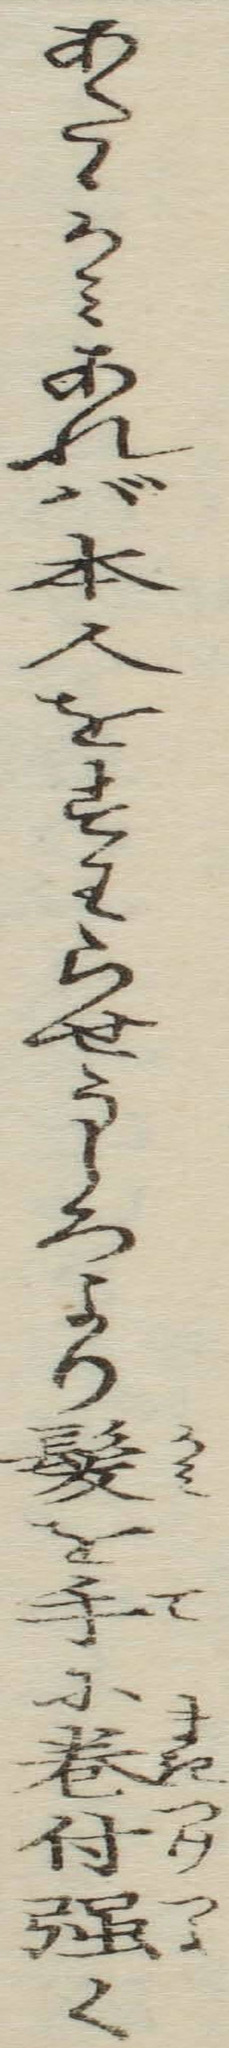あたゝたかみあれば本人をすわらせうしろより髪を手に巻付強く

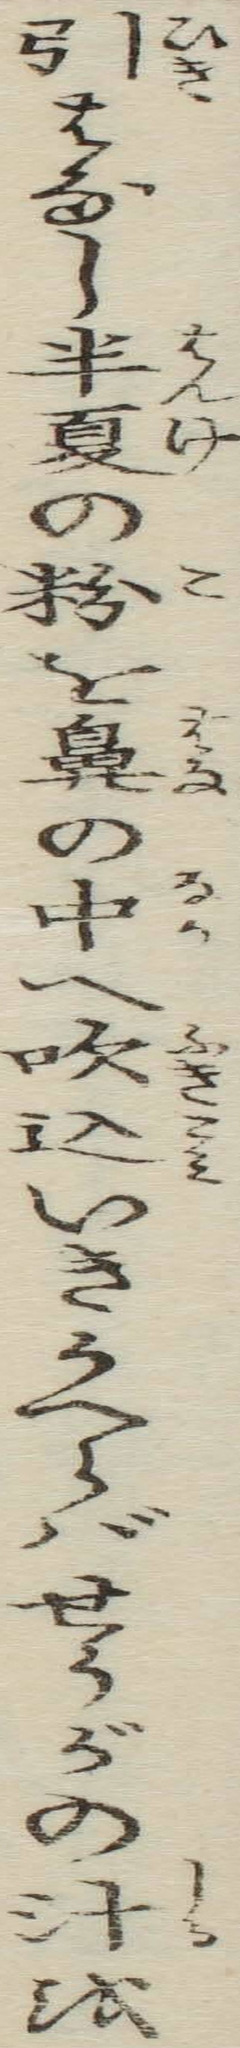引はなし半夏の粉を鼻の中へ吹込いきかへらばせうがの汁を
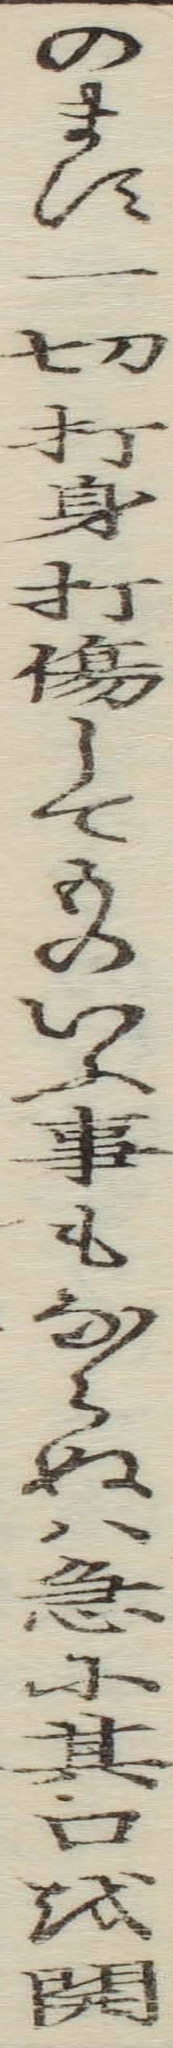のます一切打身打傷してものいふ事もならぬは急に其口を開
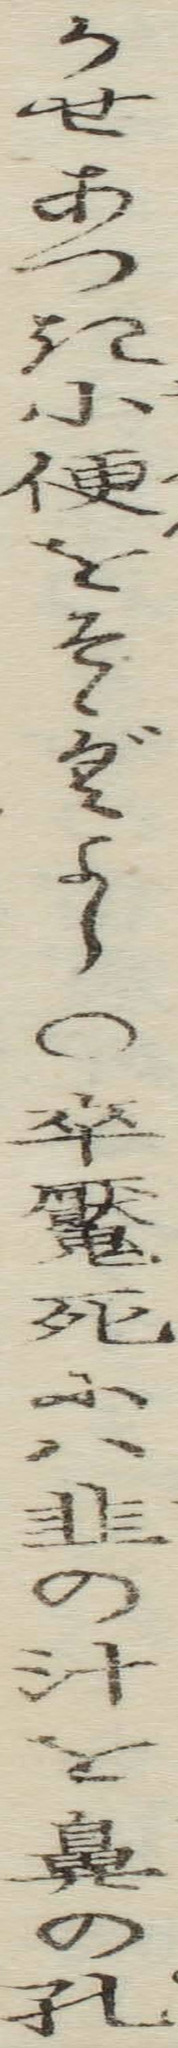かせあつき小便をそゝぐよし○卒魘死には韮の汁を鼻の孔
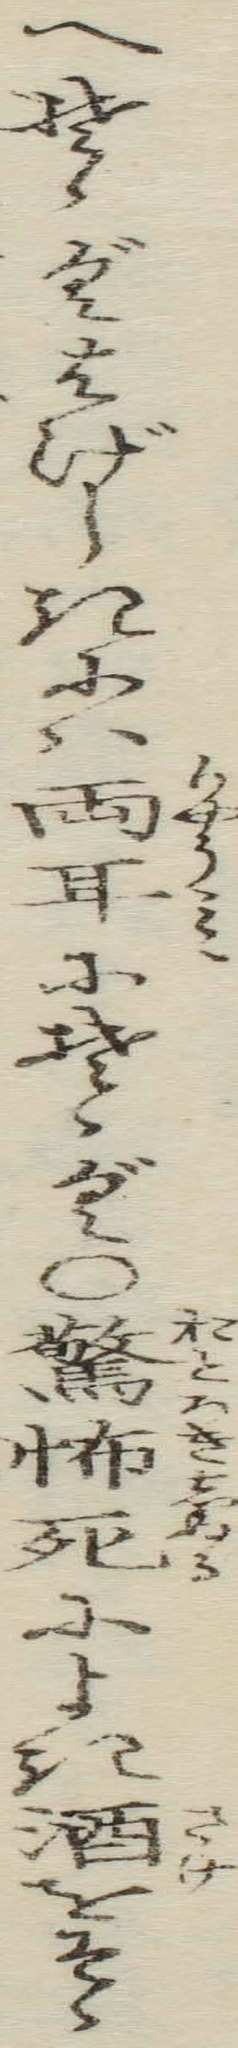へそゝぐはげしきには両耳にそゝぐ○驚怖死によき酒をそゝ
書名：救荒便覧
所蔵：国文学研究資料館
